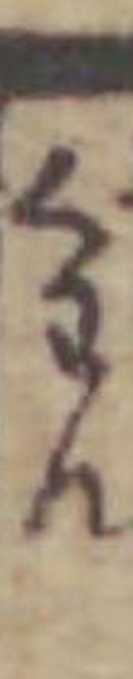くわん
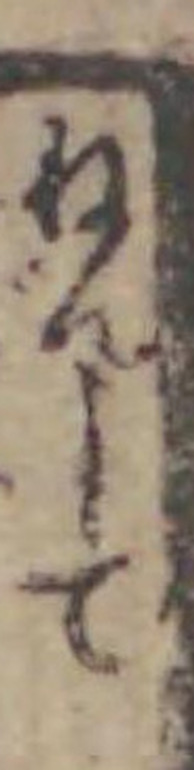ねんして
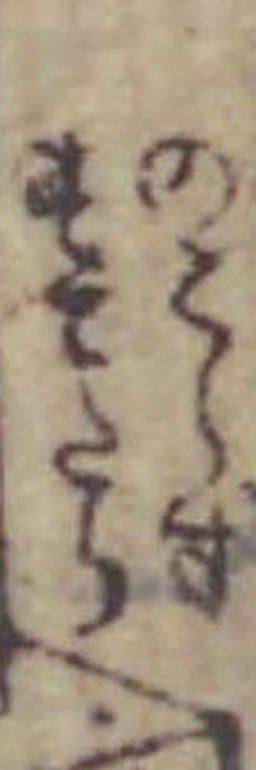すてたら
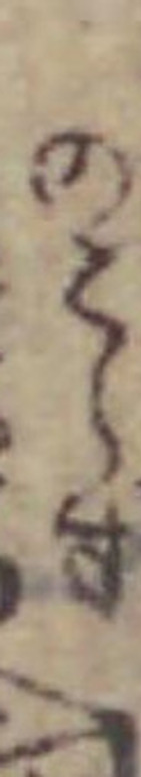のこらず
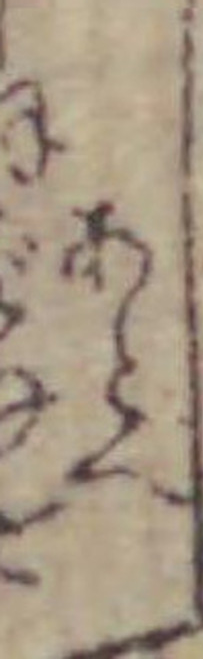あとへ
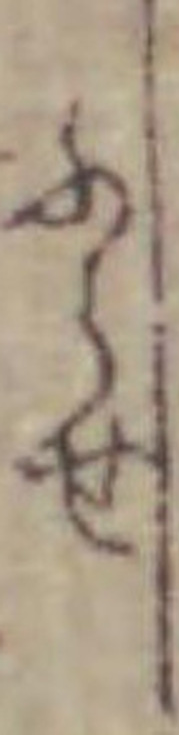ふらせ
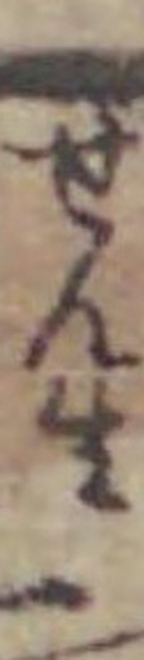せん生
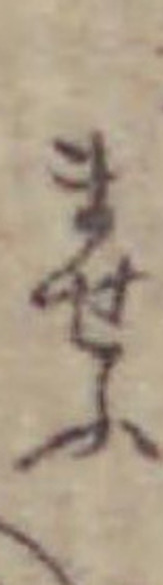ませふ
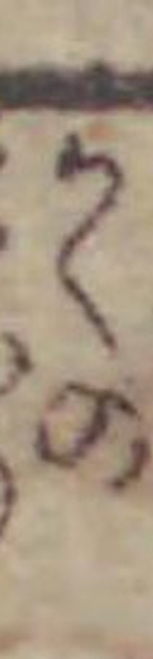かくの
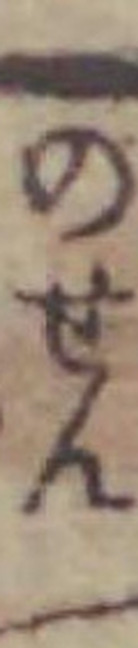のせん
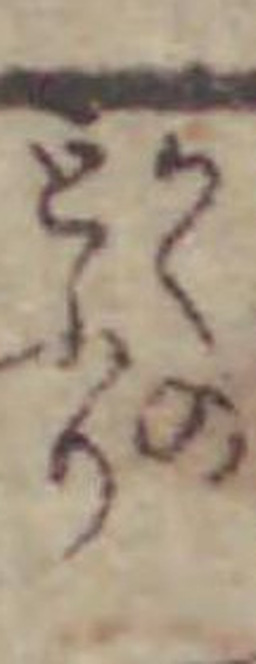とふり
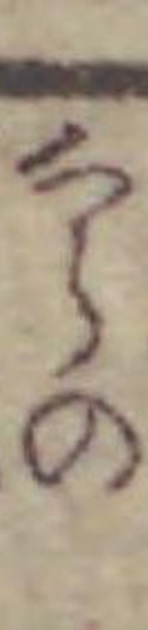くらの
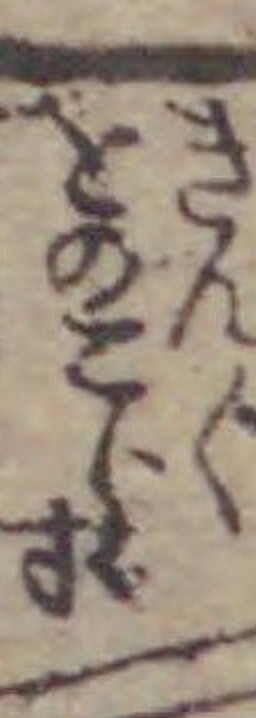をのこらす
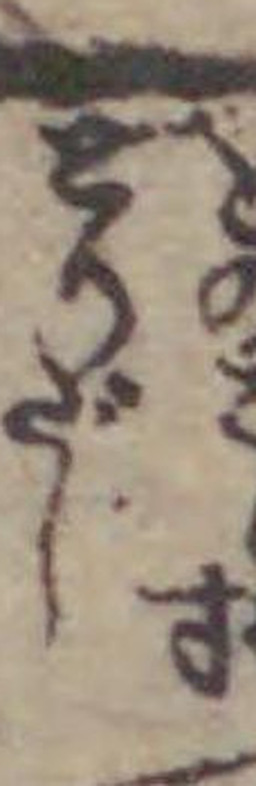とりだし
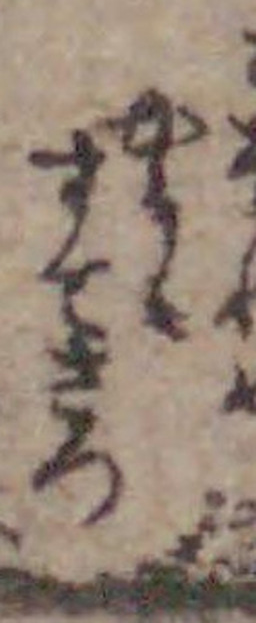すてさつ
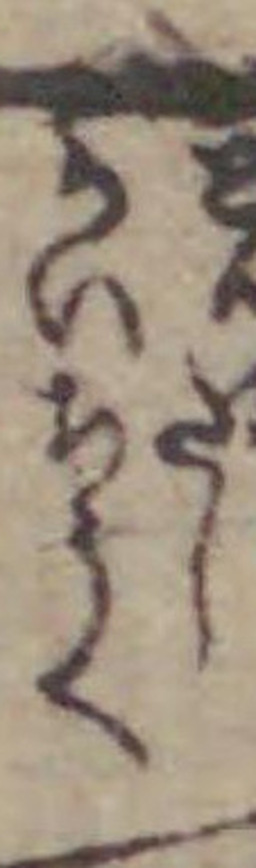かいちうへ
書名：莫切自根金生木 : 3巻
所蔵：国立国会図書館 National Diet Library, JAPAN
